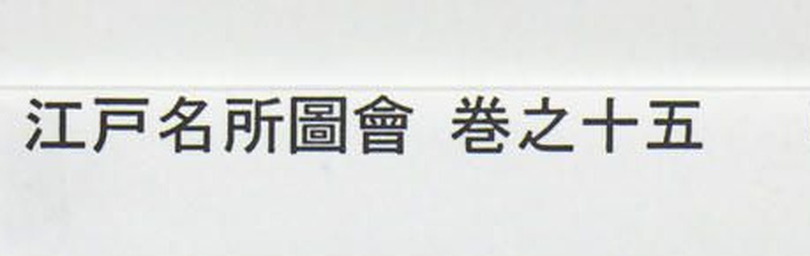江戸名所圖會十五

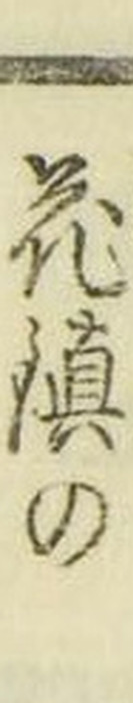花鎮の
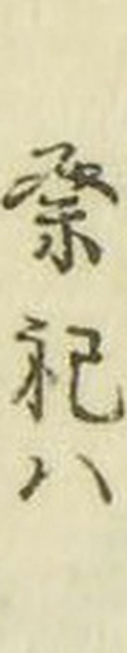祭祀は
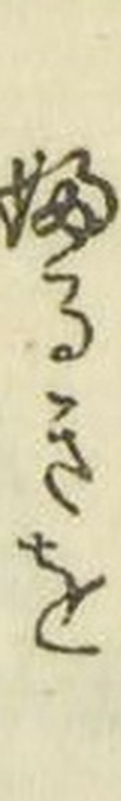ふるきを
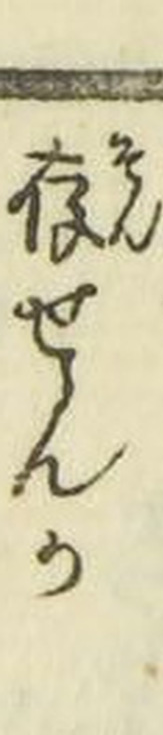存せんか
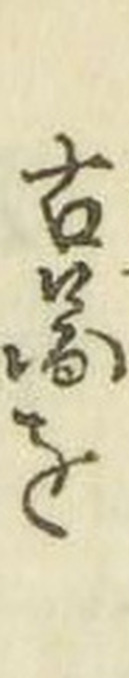古図を
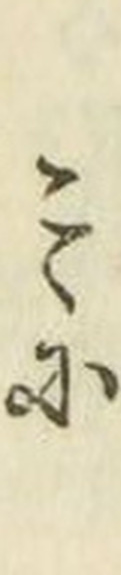こゝに

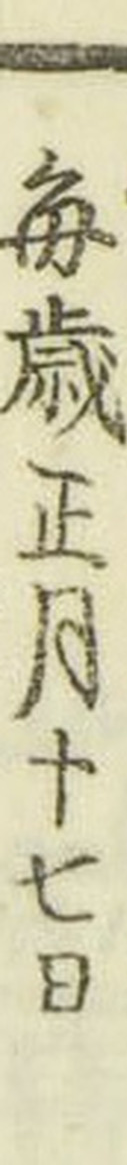毎歳正月十七日
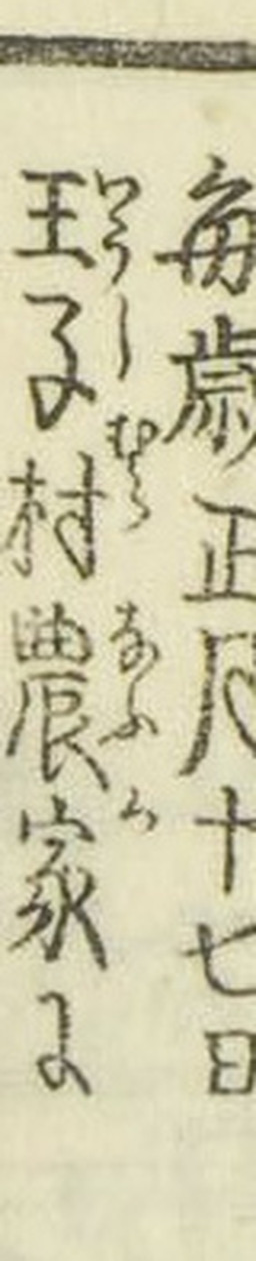王子村農家に
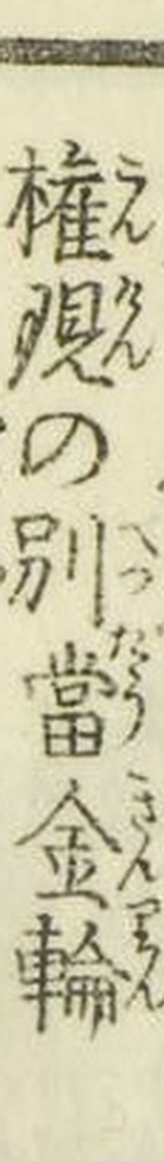権現の別当金輪
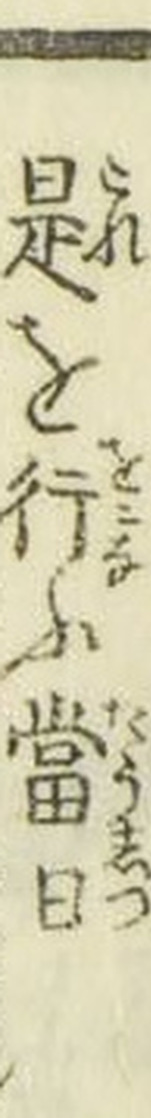是を行ふ当日
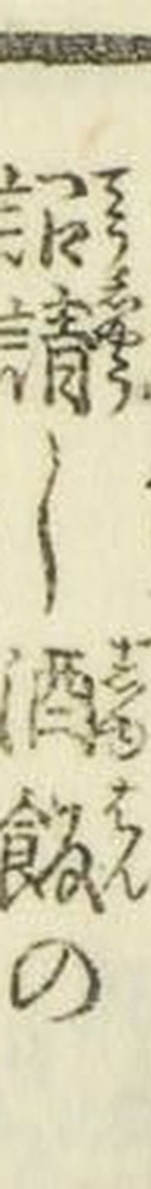詔講し酒飯の
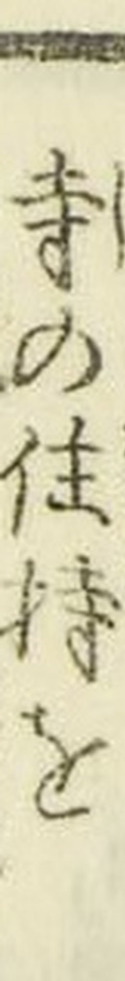寺の住持を
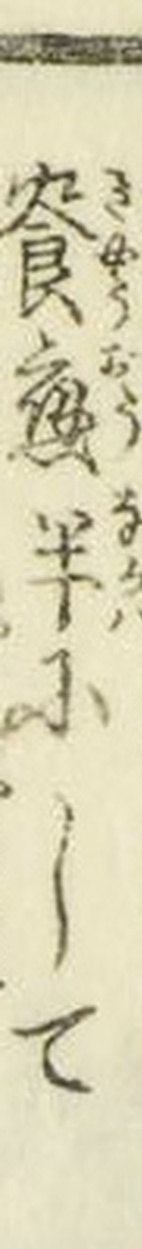饗応半にして
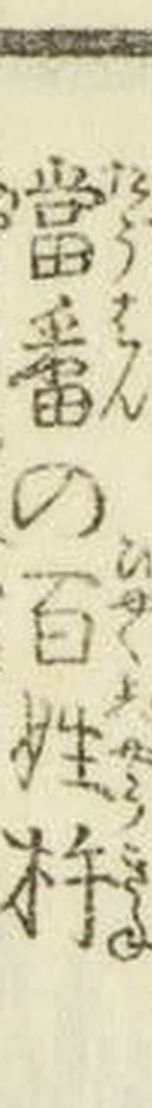当番の百姓杵
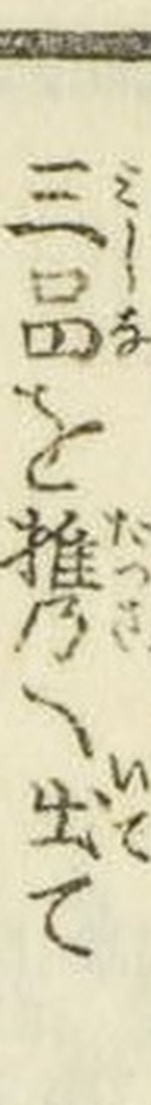三品を携へ出て
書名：江戸名所図会 20巻 巻之15
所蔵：東京学芸大学教育コンテンツアーカイブ
